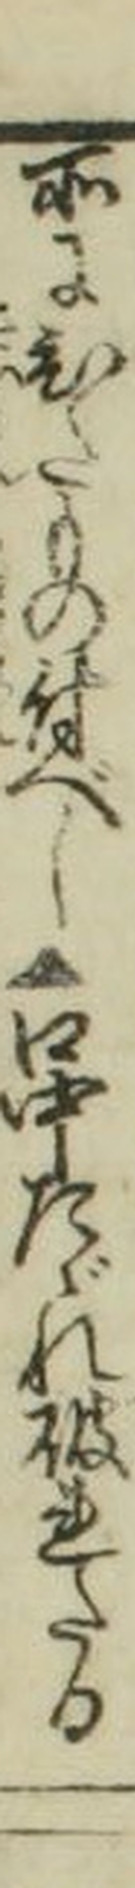所にひたもの付べし▲口中たゞれ破れたる
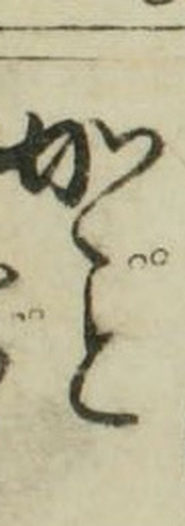かごと
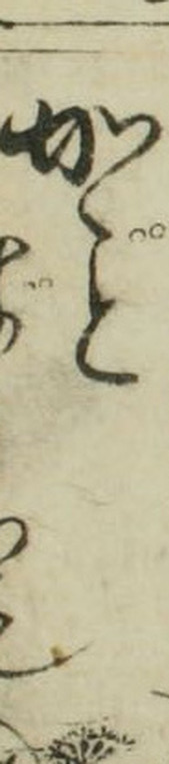かごと
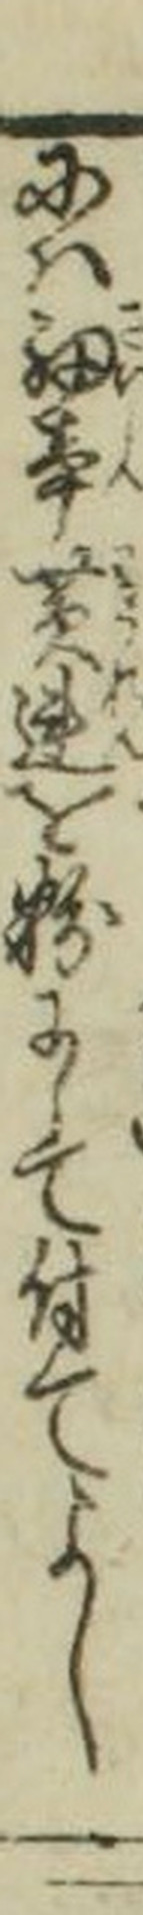には細辛黄連を粉にして付てよし
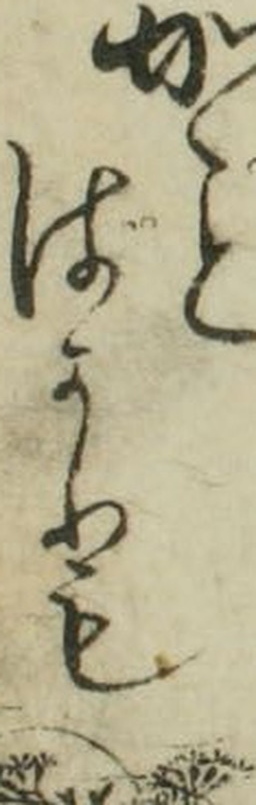ばかりも
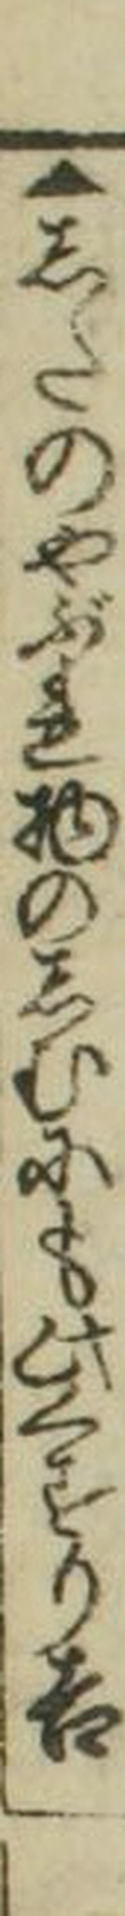▲したのやぶれ物のしむにも此くすり吉

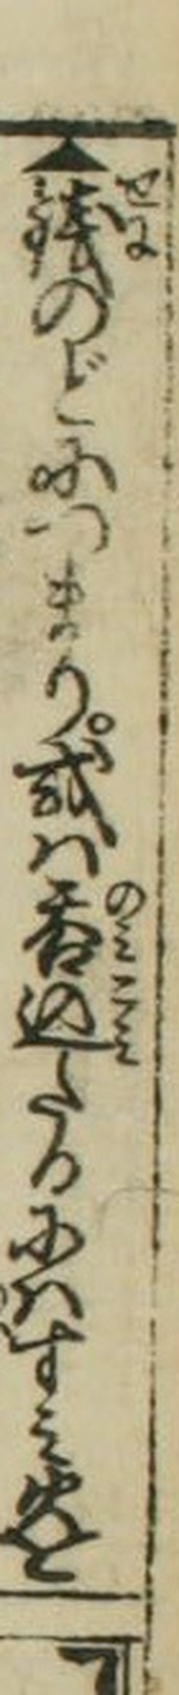▲銭のどにつまり。或は呑込たるにはすみ火を
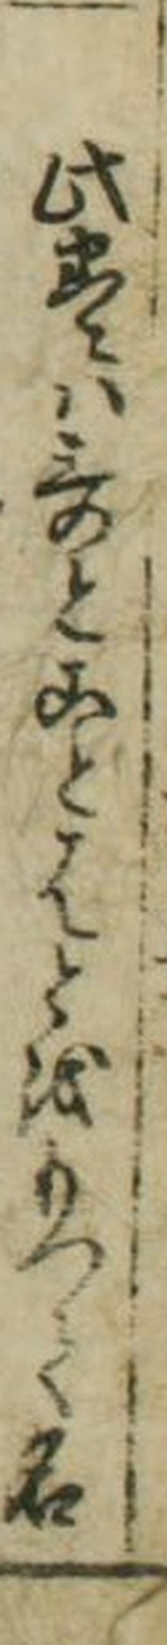此巻は哥とことはとをもつて名
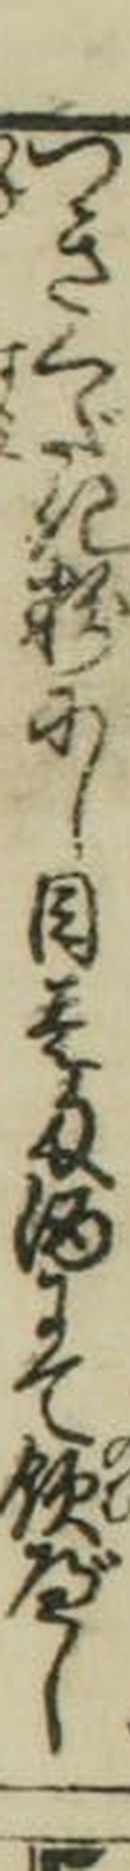つきくだき粉にし目壱匁酒にて飲べし
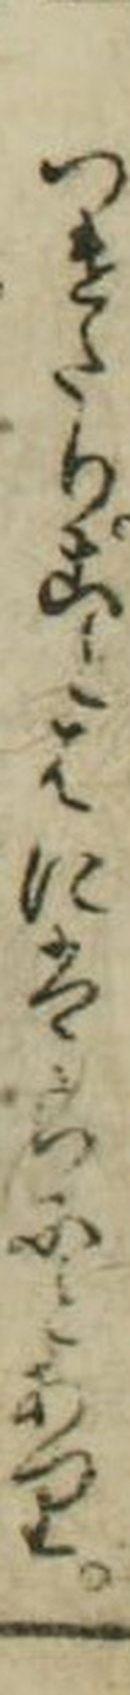つけたり。ことはにはらにとあり。
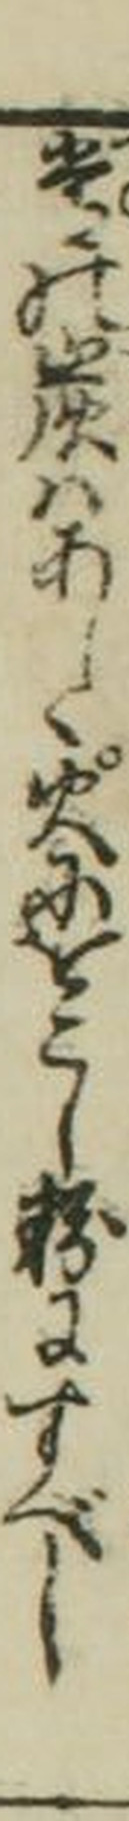常の炭はあしく。火にをこし粉にすべし
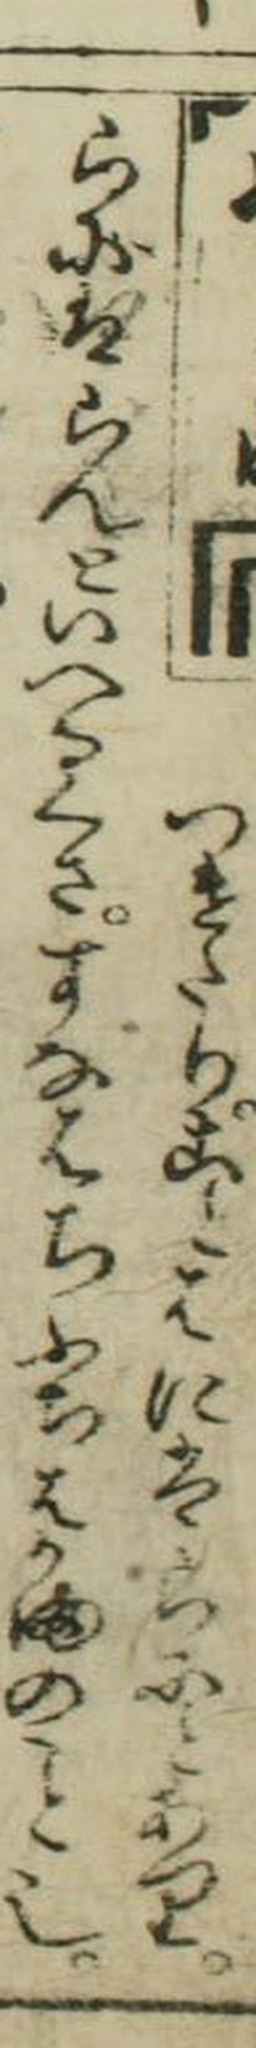らにはらんといへるくさ。すなはちふちはかまのこと也。
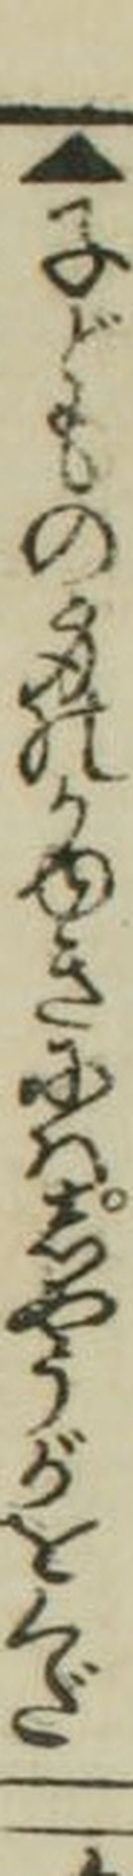▲子どもの身のかゆきには。しやうがをくだ
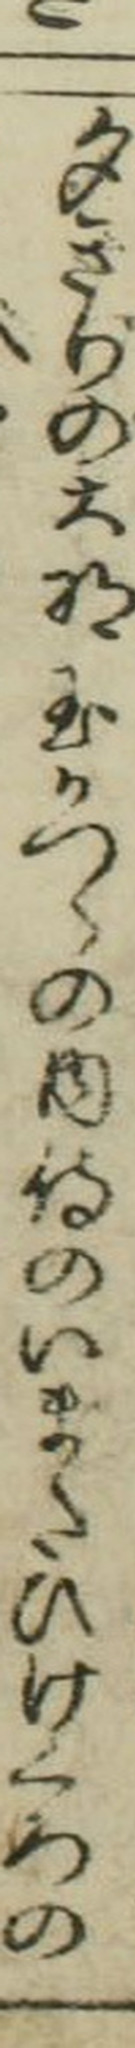夕きりの大将玉かつらの内侍のいまたひけくろの
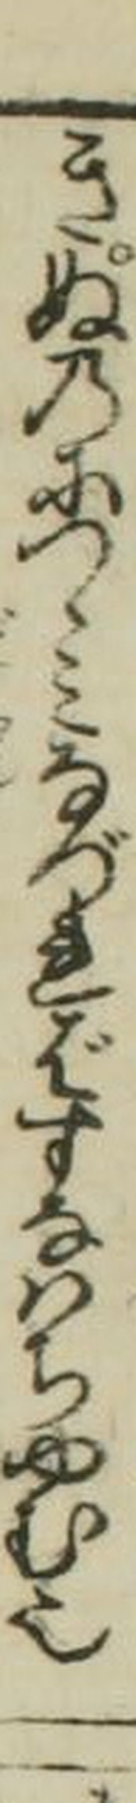き。ぬのにつゝみなづればすなはちやむ也
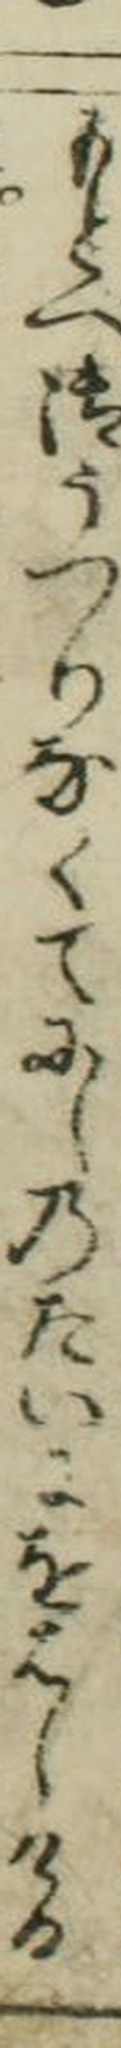もとへ御うつりなくてにしのたいにをはしける
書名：女源氏教訓鑑
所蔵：東京学芸大学附属図書館
